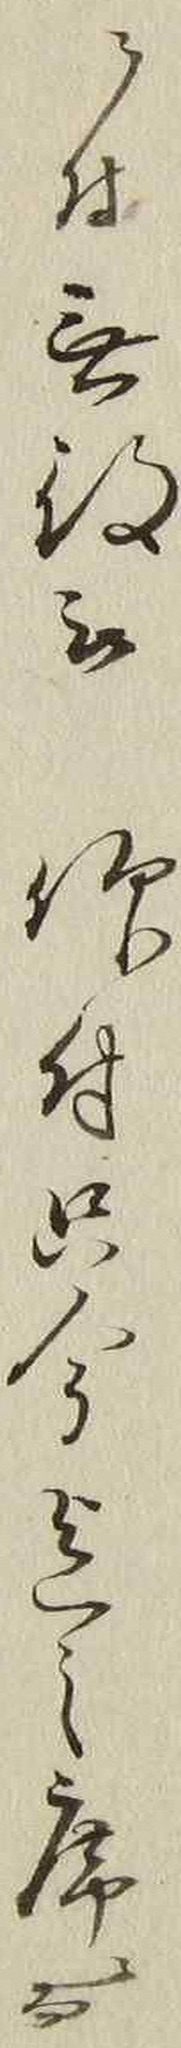ニ付無役被仰付只今迄之席ニ而
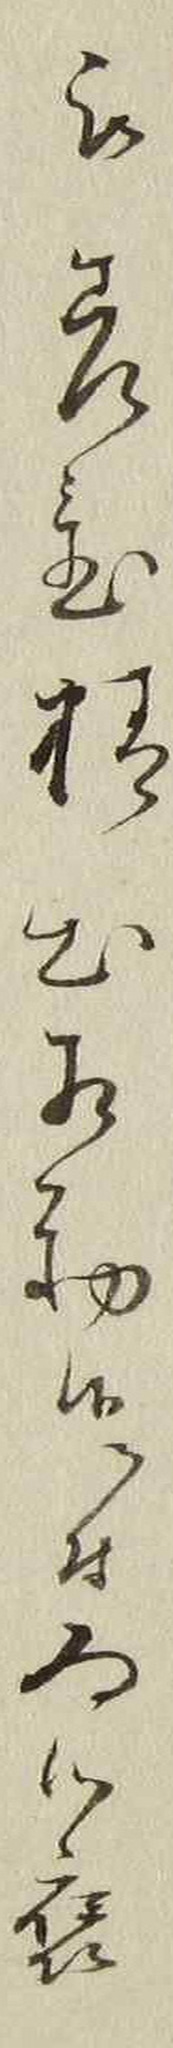被差置精出相勤候ニ付為御褒
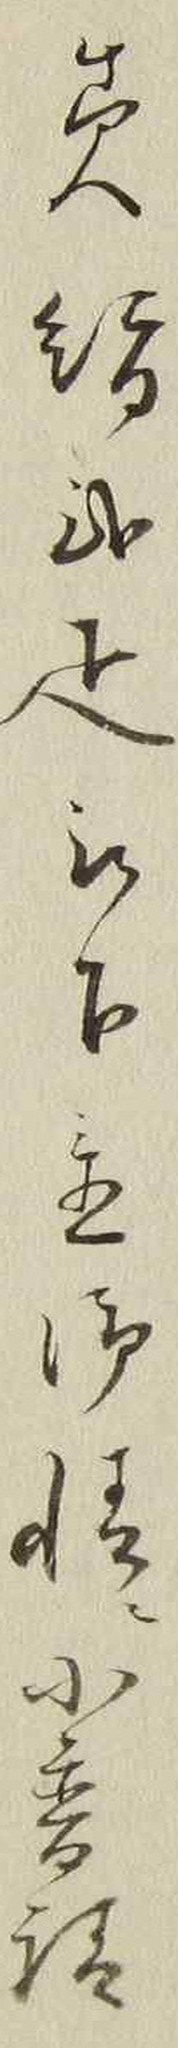美絹弐疋被下置御情ニ小普請
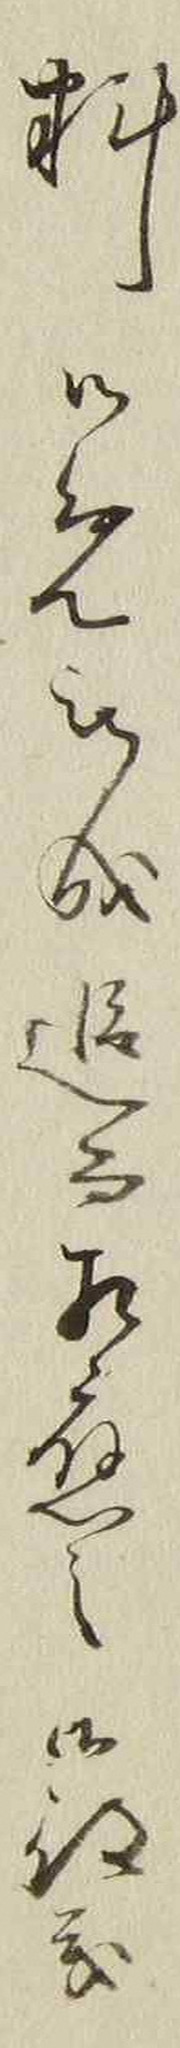料御免被成追而相応之御役義
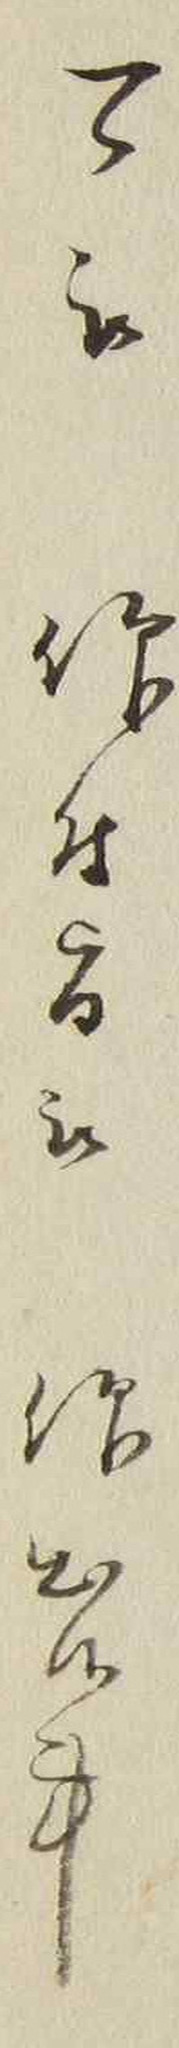可被仰付旨被仰出候事
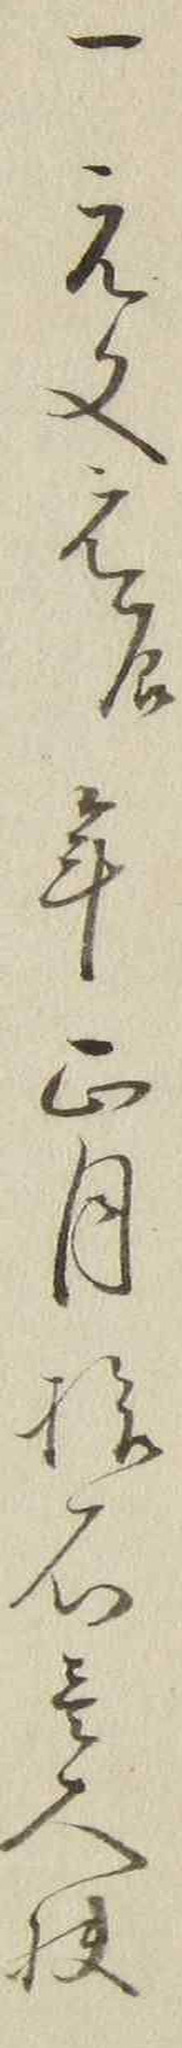一元文元辰年正月拾石壱人扶
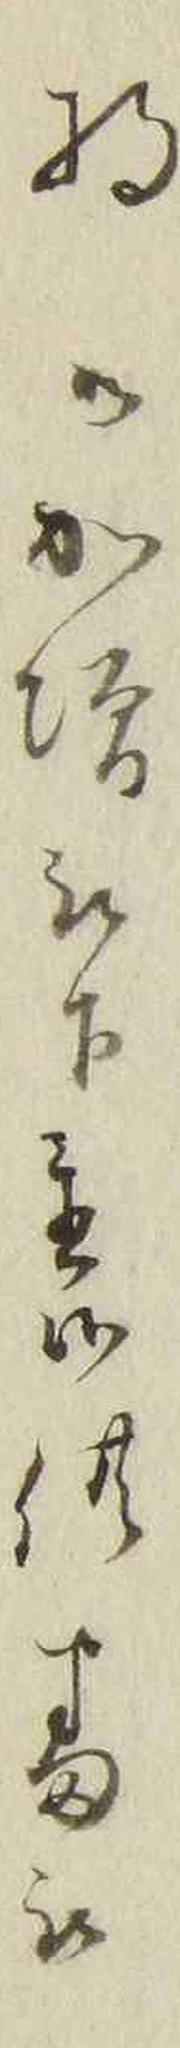持御加増被下置御供番被

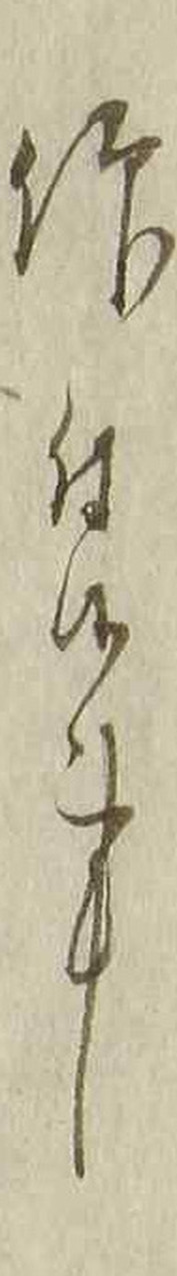仰付候事
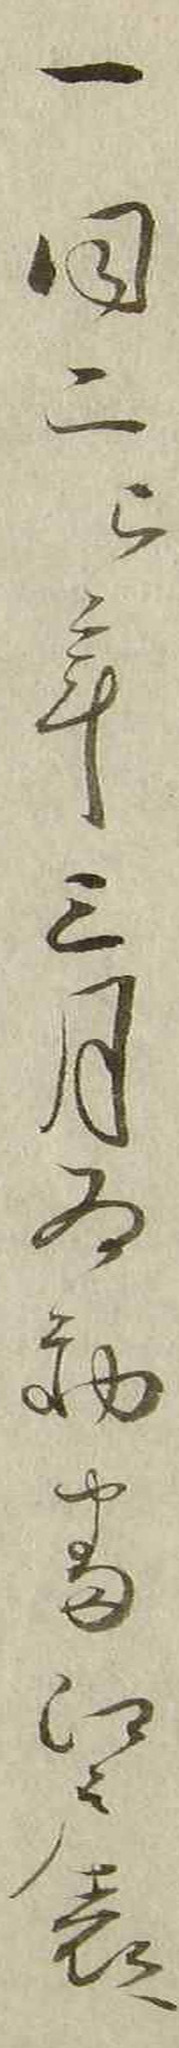一同二巳年三月為勤番江戸表へ
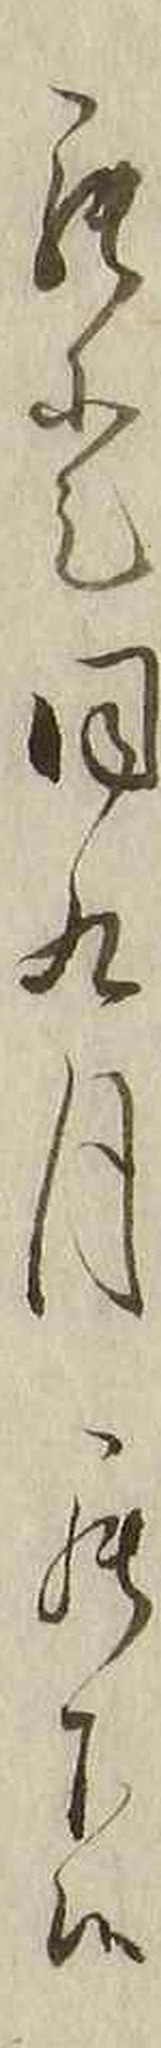罷登同九月罷下候
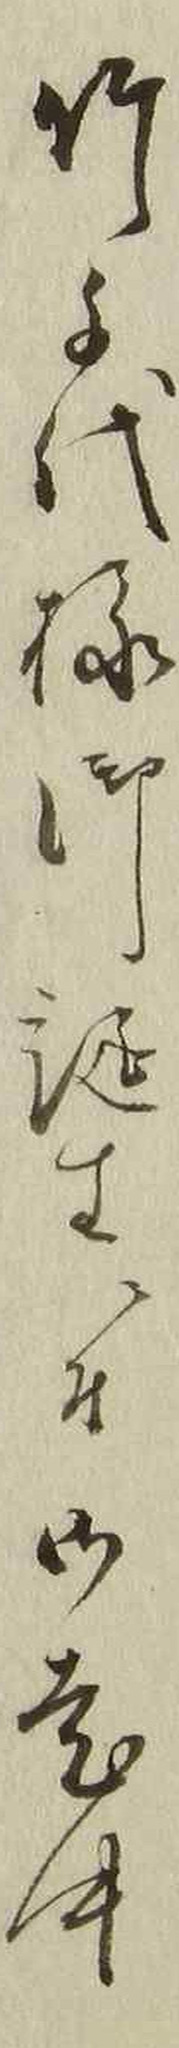竹千代様御誕生ニ付御老中
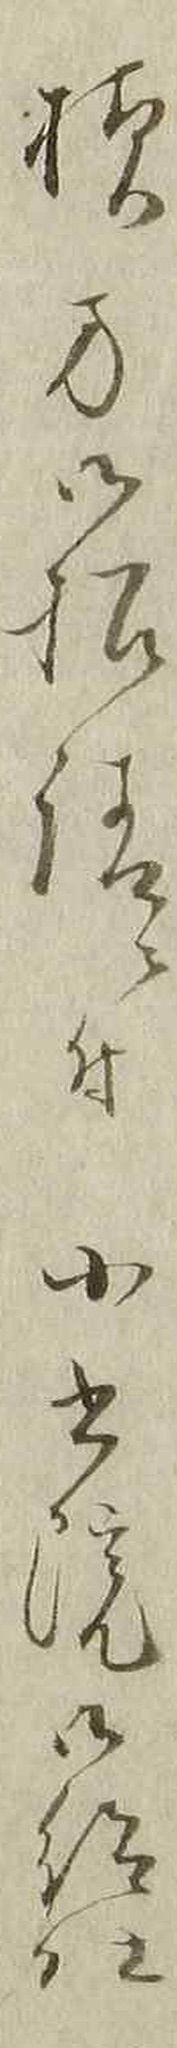様方御招請ニ付小書院御給仕
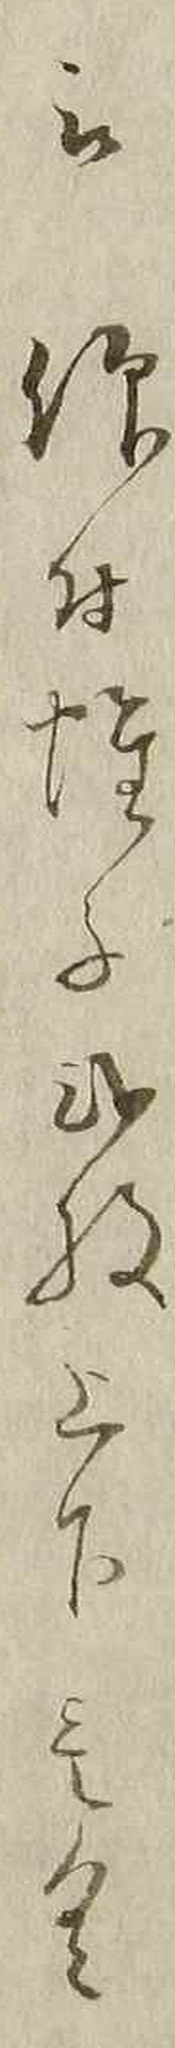被仰付帷子弐枚上下壱具
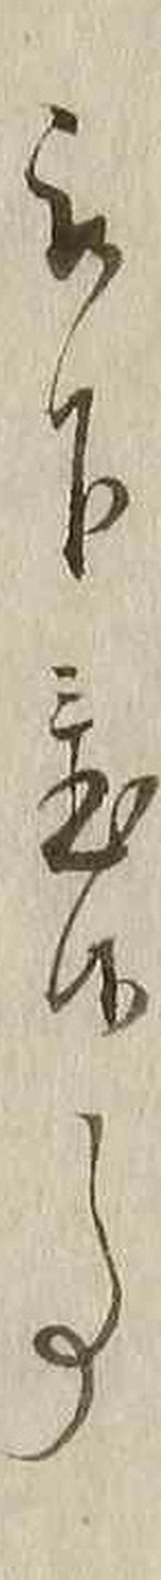被下置候事
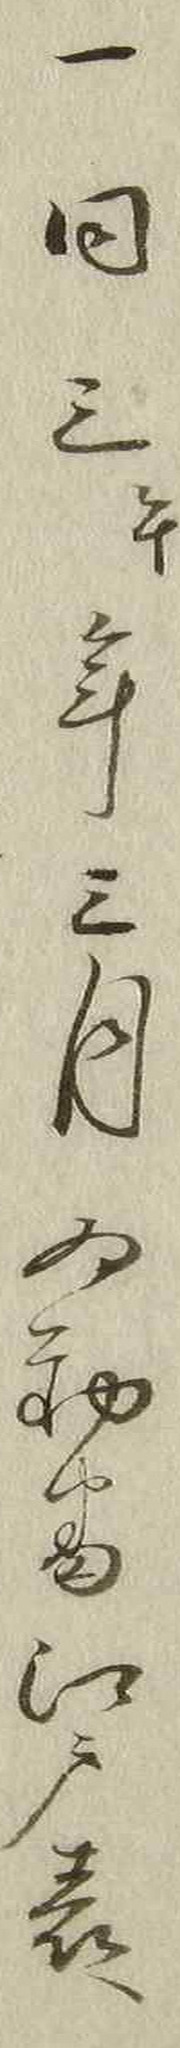一同三午年三月為勤番江戸表へ
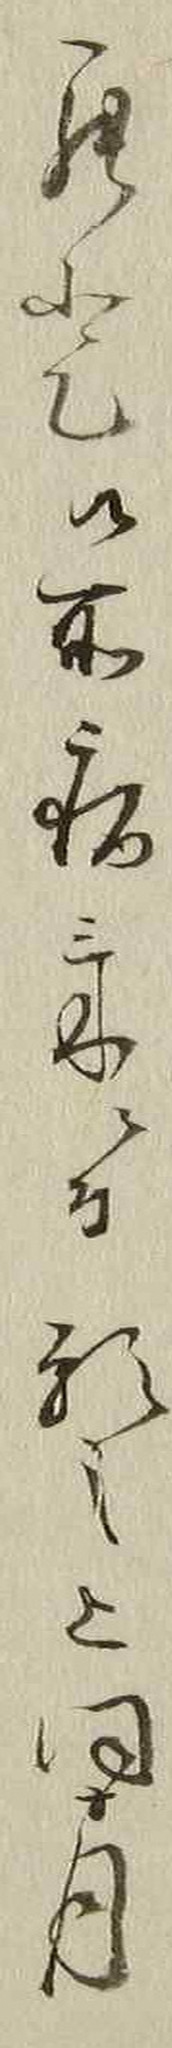罷登候所病気ニ付願之上同十月
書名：諸士系譜　巻之129　た之部5
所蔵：会津若松市立会津図書館
